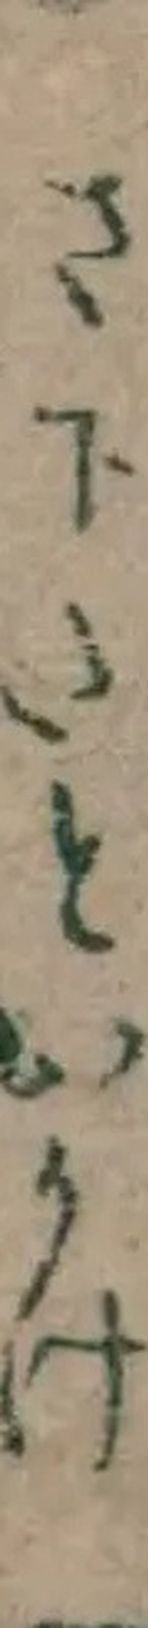さ下たと出かけ
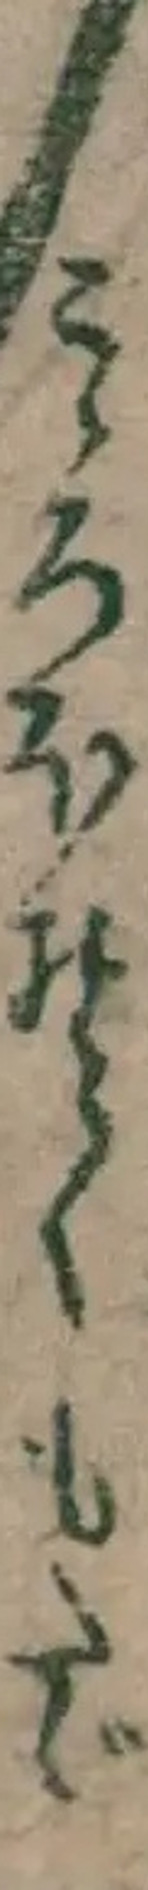こゝろほそくもたゞ
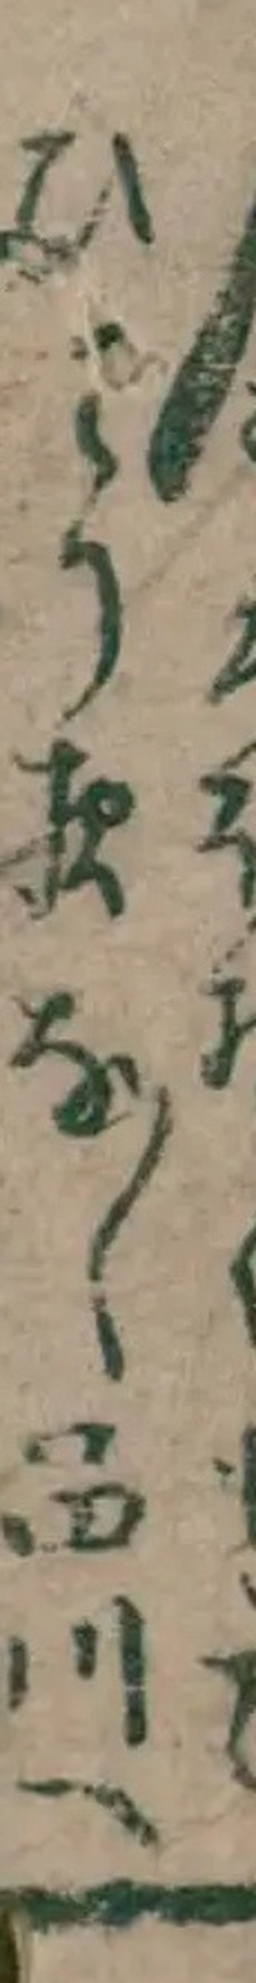ひとり夜な〳〵品川へ
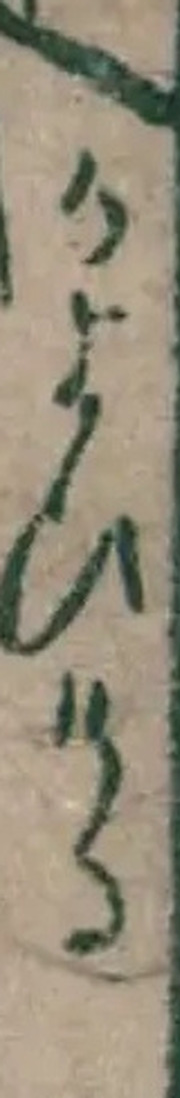かよひける
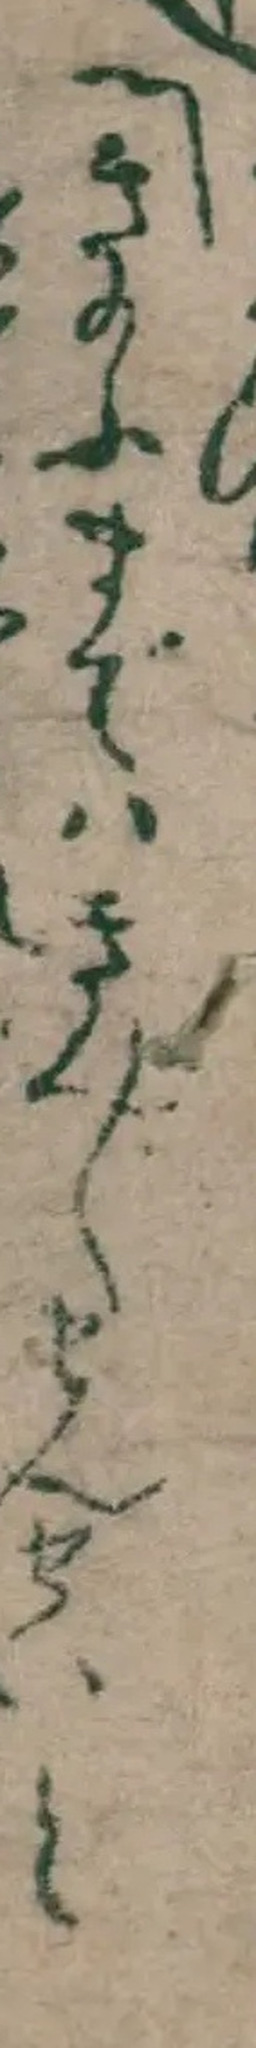〽きのふまではきん〳〵せんせいと
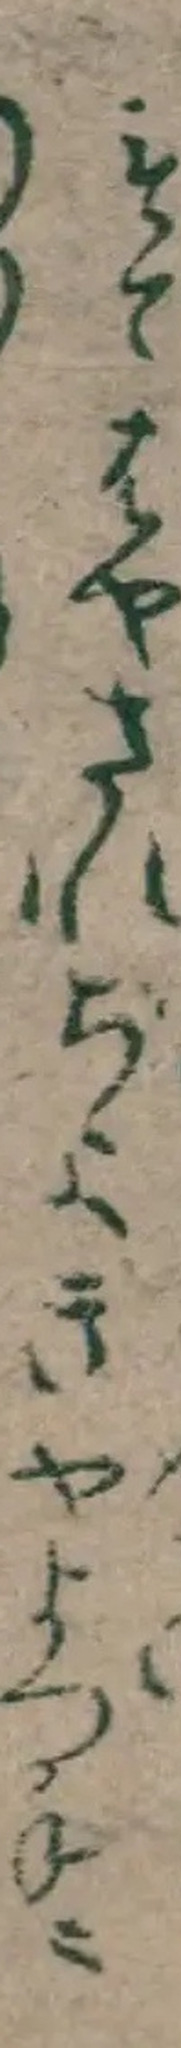もてはやされちよきやよつ手に
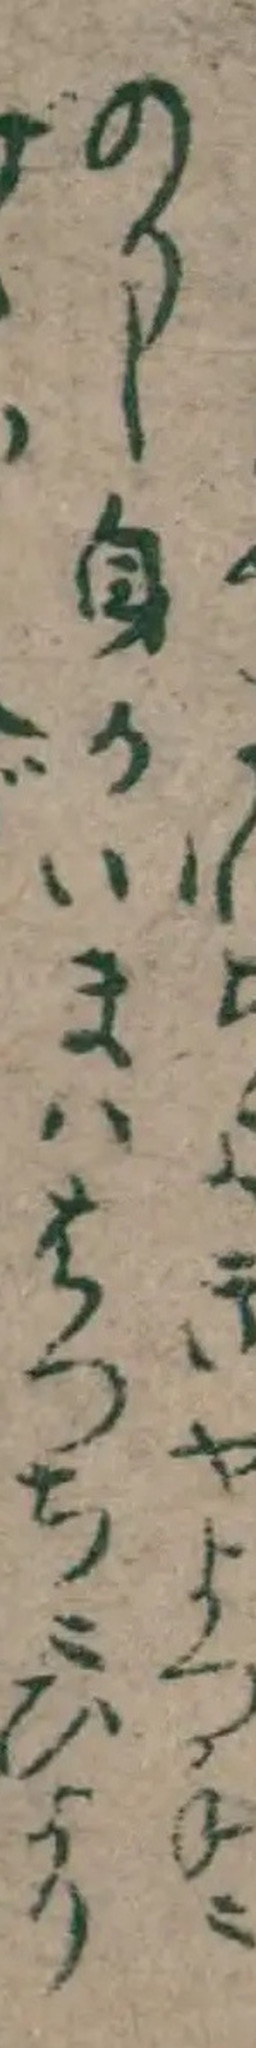のりし身かいまははつちにひより
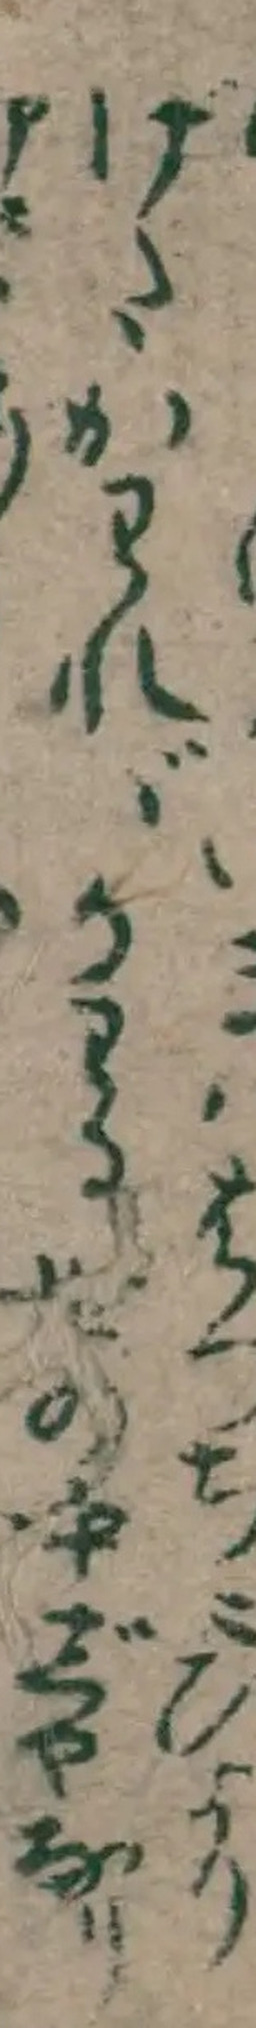げたかわればかわる世の中じやなり
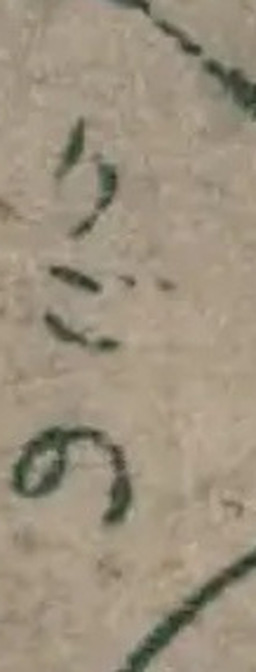かごの
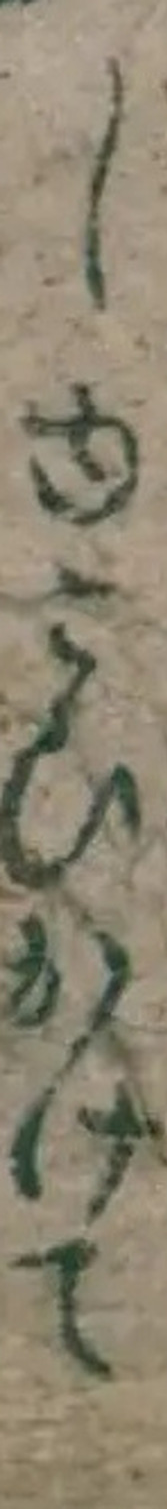しゆこひかけて
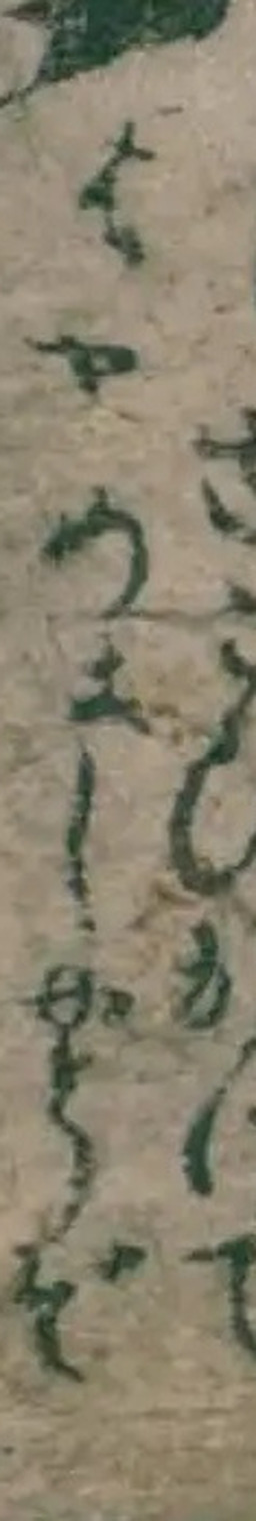はやのましやうぞ

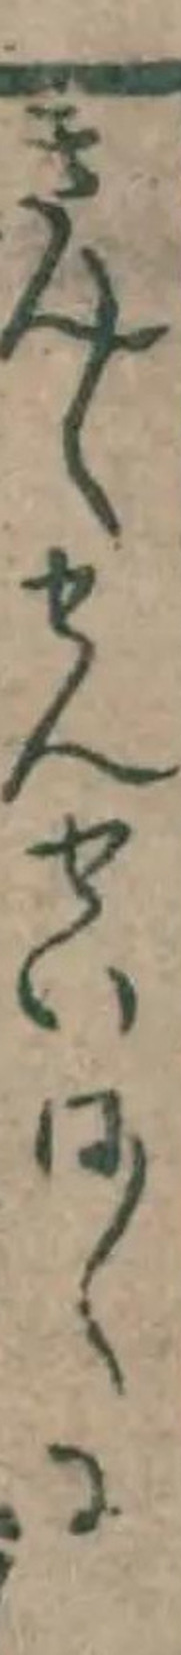きん〳〵せんせいは日〳〵に
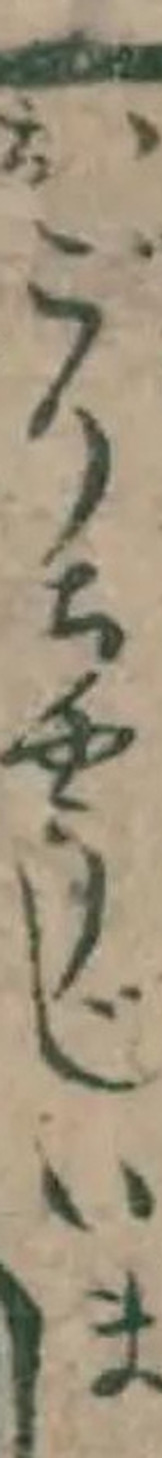おごりちやうじいまは
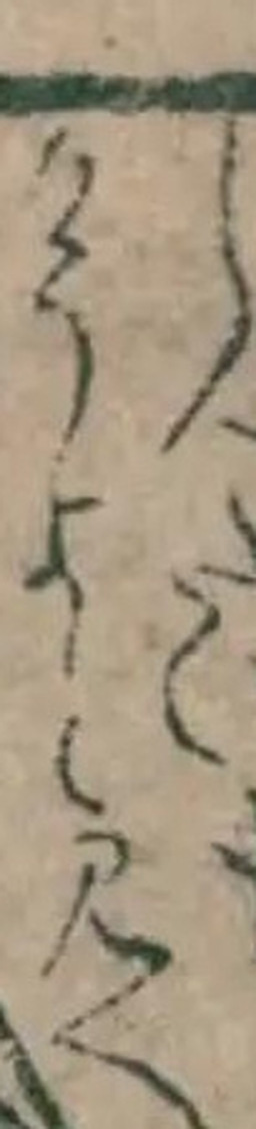かうよと見へ
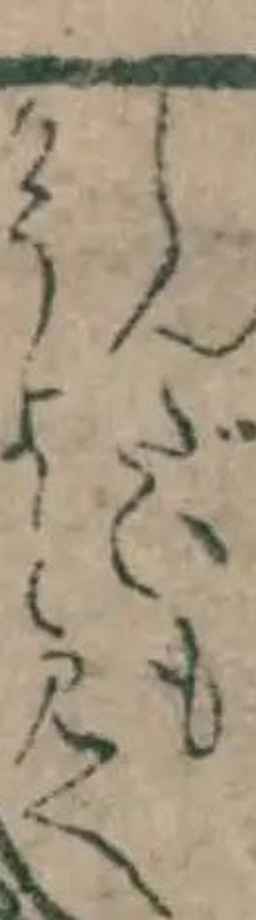かうよと見へ
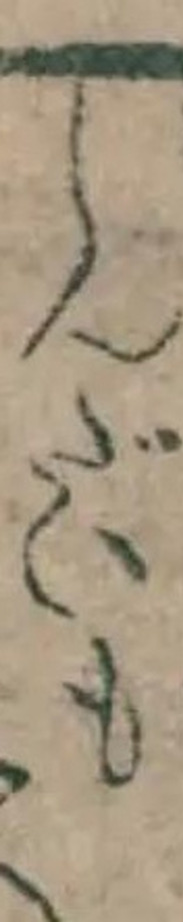しんだいも
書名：金々先生栄花夢 : 2巻
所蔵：国立国会図書館 National Diet Library, JAPAN
